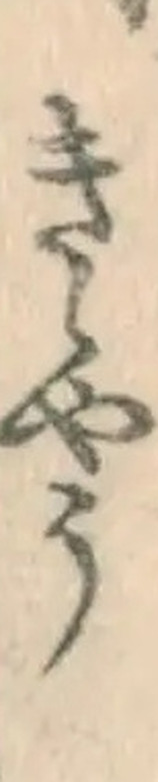きゝやう
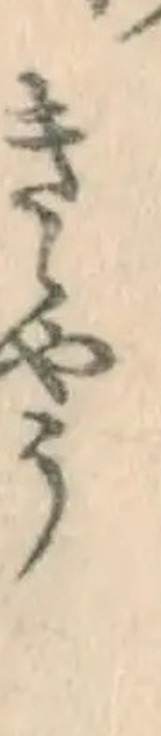きゝやう
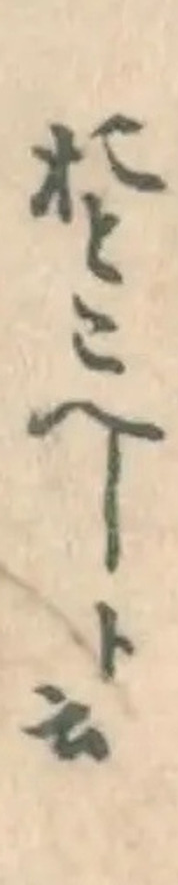とこへしと云
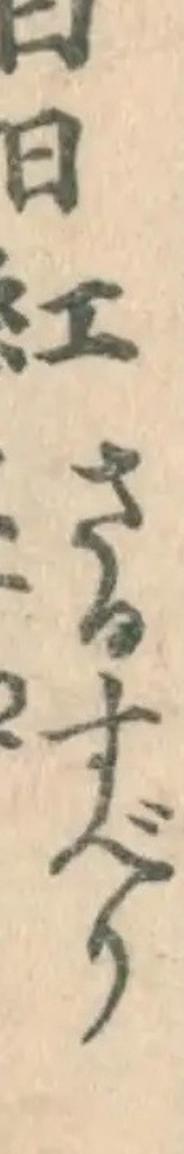百日紅さるすべり

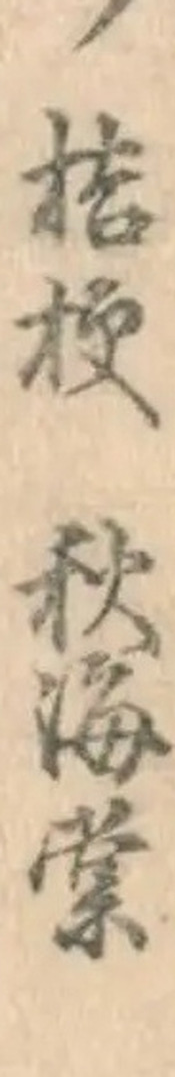桔梗秋海棠
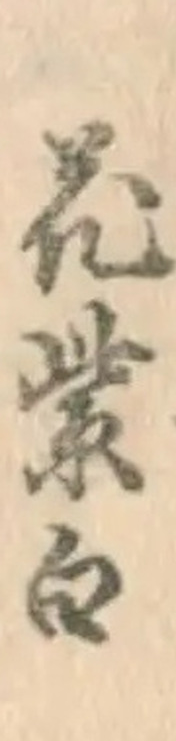花紫白
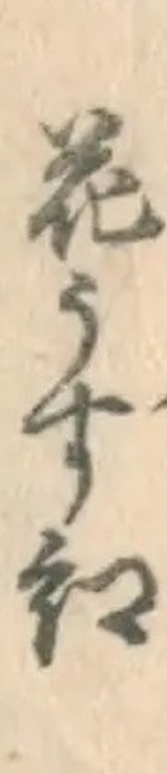花うす紅
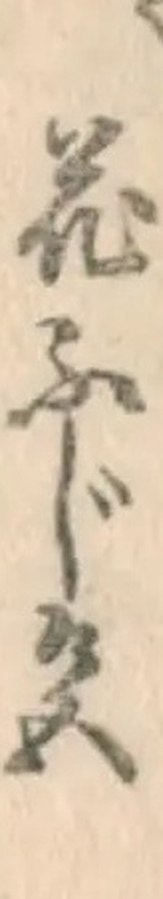花ふじ色
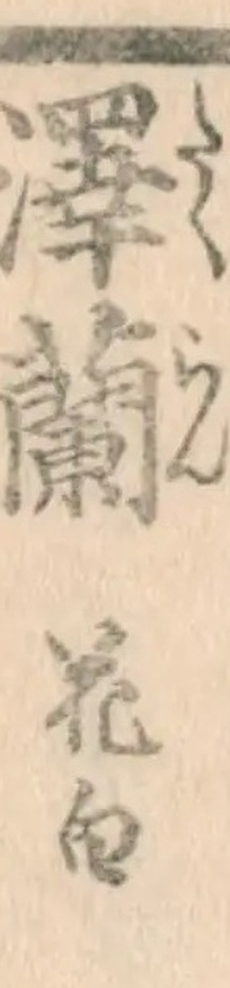澤蘭花白
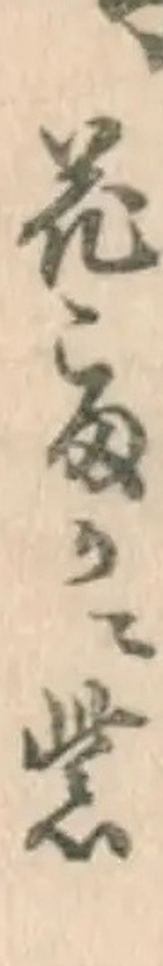花こまかに紫
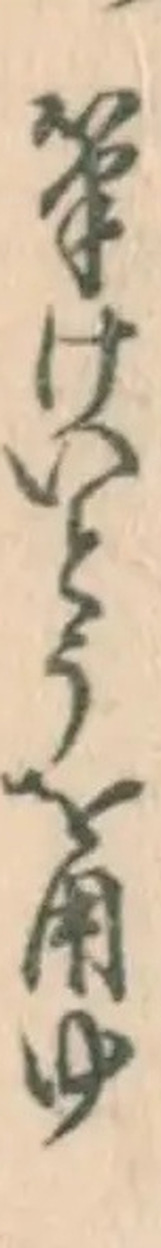葉けいとうを用ゆ
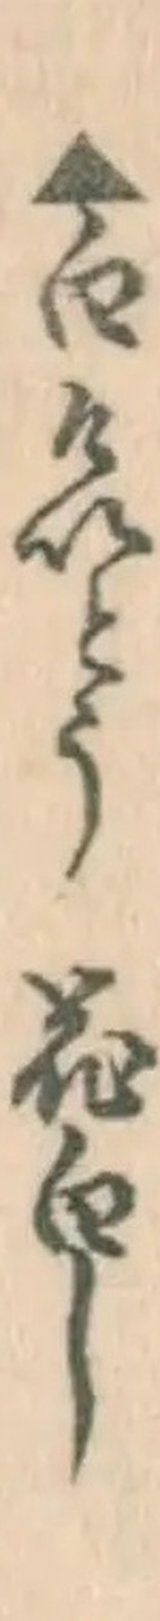▲白けいとう花白し
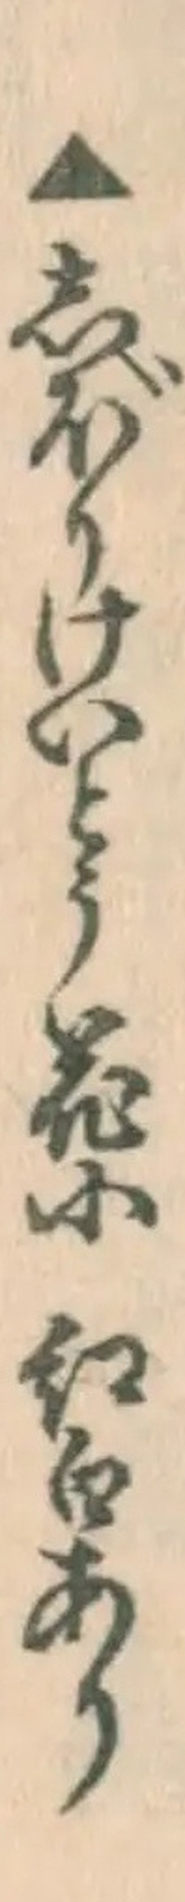▲しぼりけいとう花小紅白あり
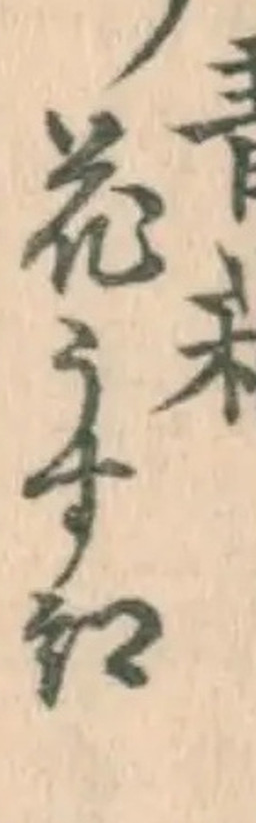花うす紅
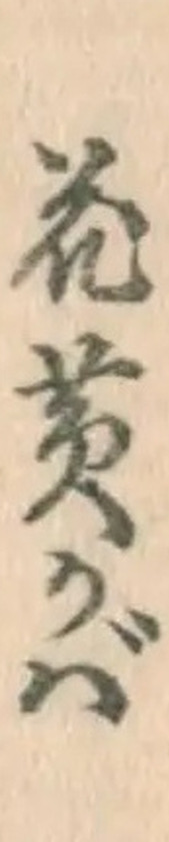花黄かバ
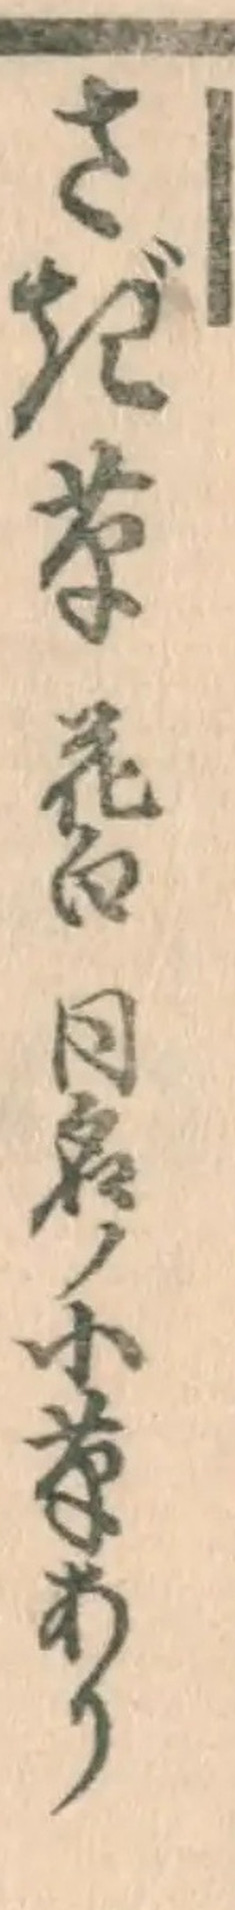さぎ草花白同名の小草あり
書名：茶席挿花集
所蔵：国立国会図書館 National Diet Library, JAPAN
